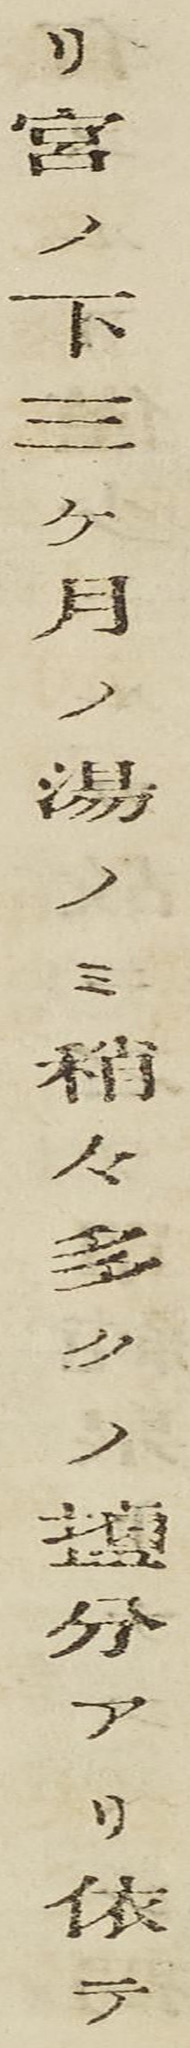リ宮ノ下三ケ月ノ湯ノミ稍々多クノ塩分アリ依テ
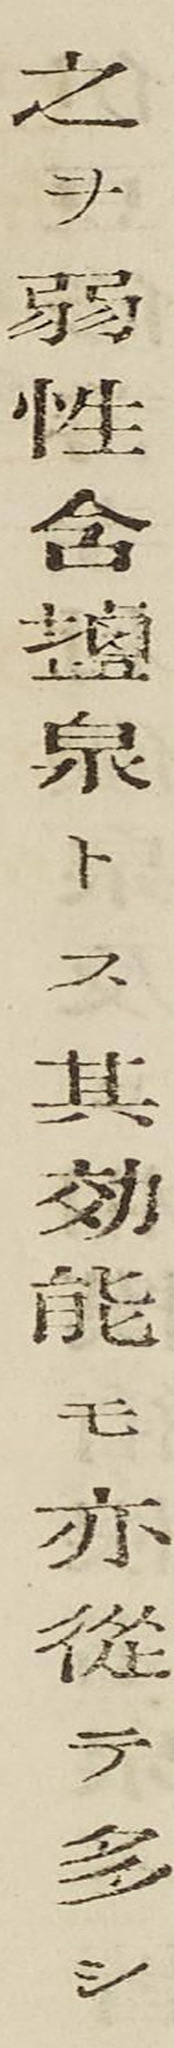之ヲ弱性含塩泉トス其効能モ亦従テ多シ
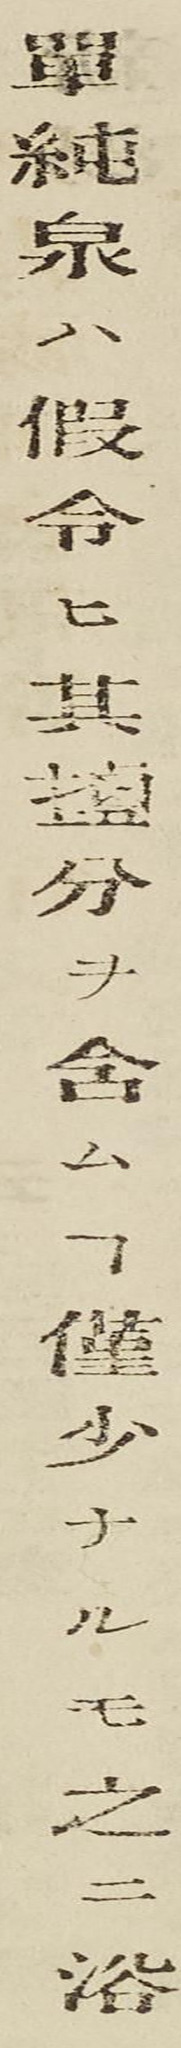単純泉ハ仮令ヒ其塩分ヲ含ムコト僅少ナルモ之ニ浴
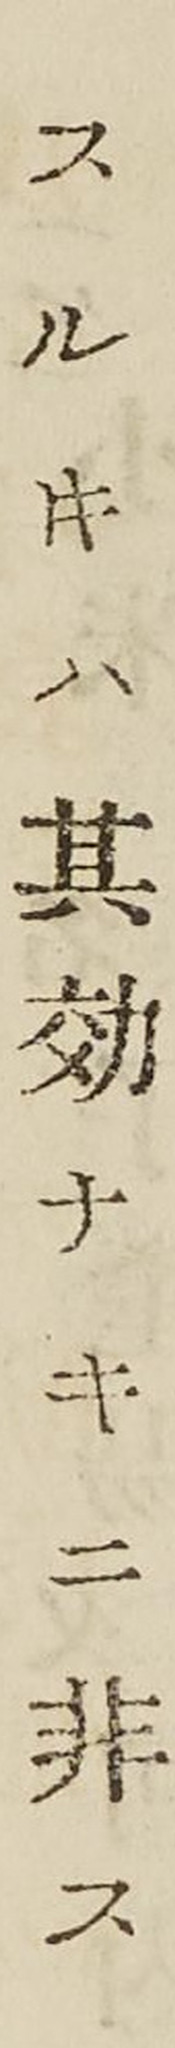スルトキハ其効ナキニ非ス
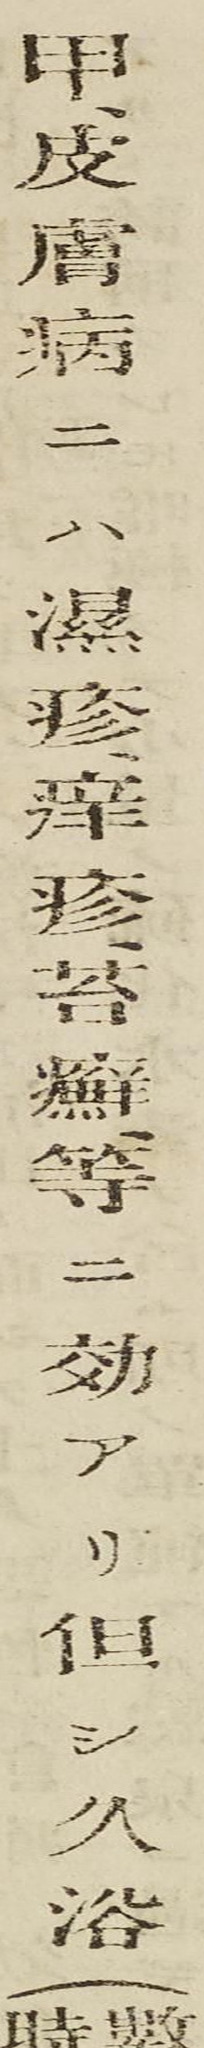甲、皮膚病ニハ湿疹、痒疹、苔癬、等ニ効アリ但シ久浴数時
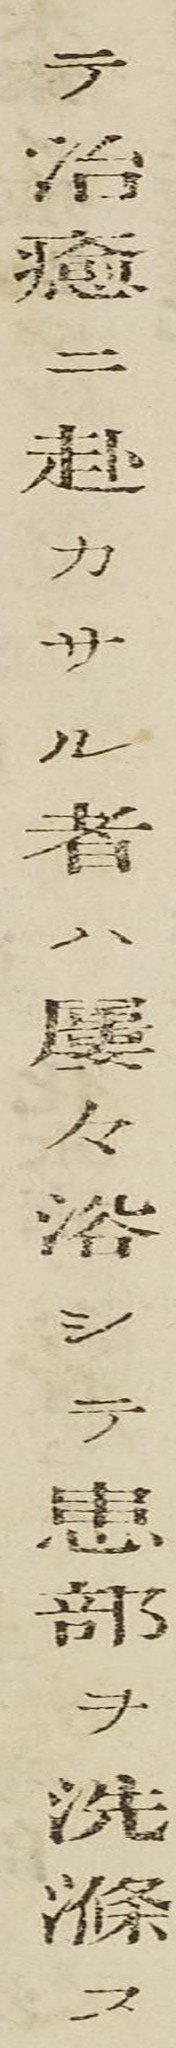テ治癒ニ赴カサル者ハ屡々浴シテ患部ヲ洗滌ス
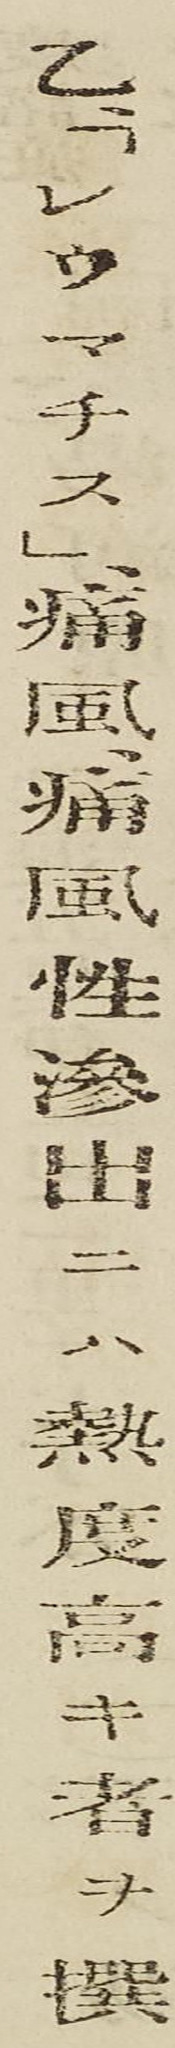乙、「レウマチス」、痛風、痛風性滲出ニハ熱度高キ者ヲ撰
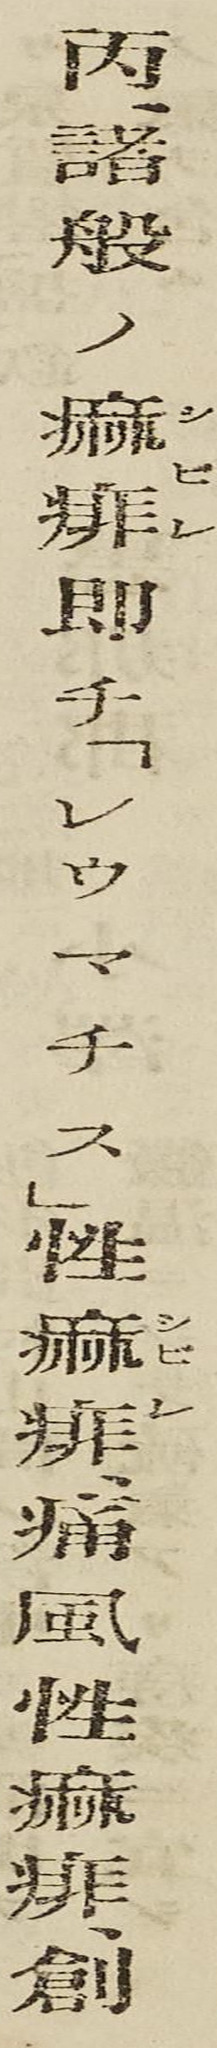丙、諸般ノ痲痱即チ「レウマチス」性痲痱、痛風性痲痱、創
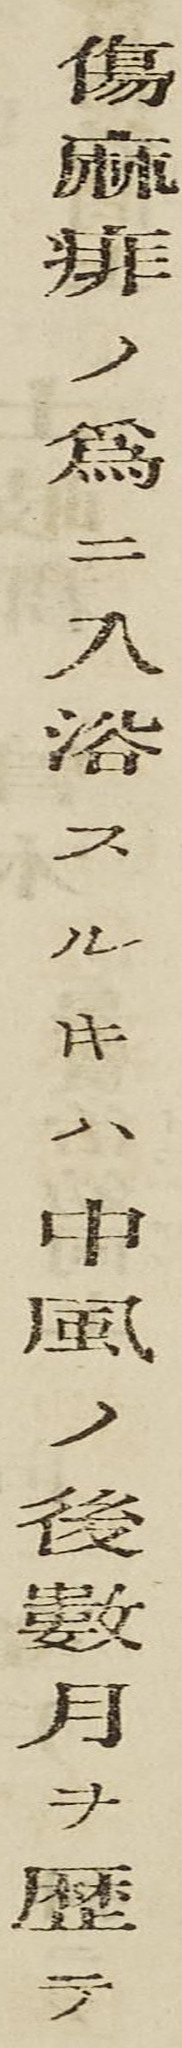傷痲痱ノ為ニ入浴スルトキハ中風ノ後数月ヲ歴テ
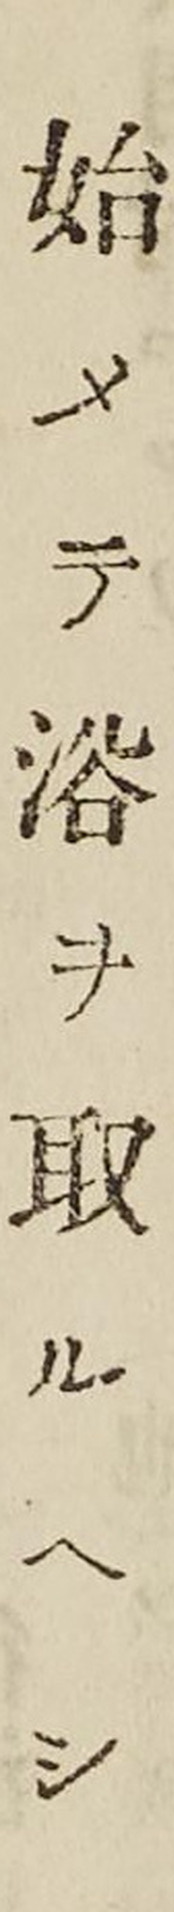始メテ浴ヲ取ルヘシ
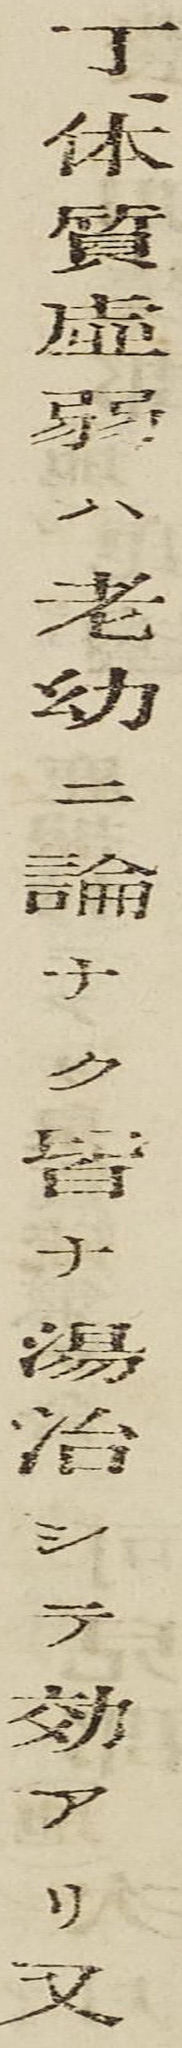丁、体質虚弱ハ老幼ニ論ナク皆ナ湯治シテ効アリ又
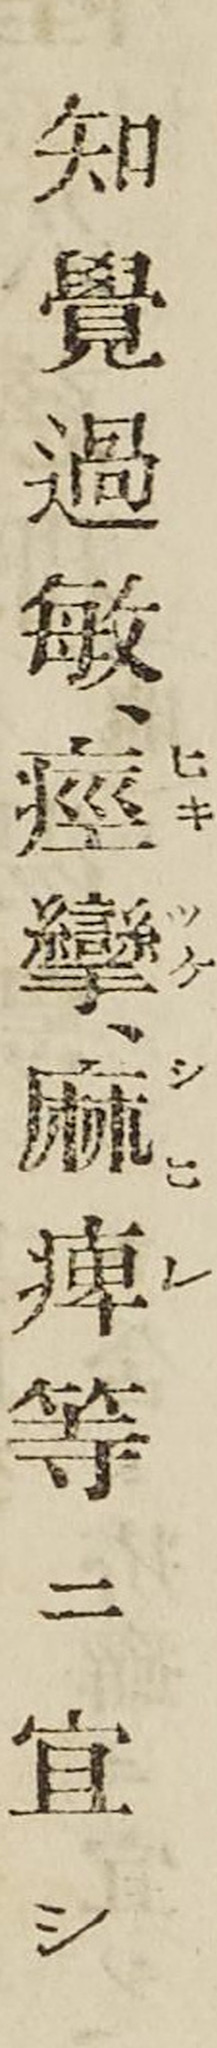知覚過敏、痙攣、麻痺等ニ宣シ
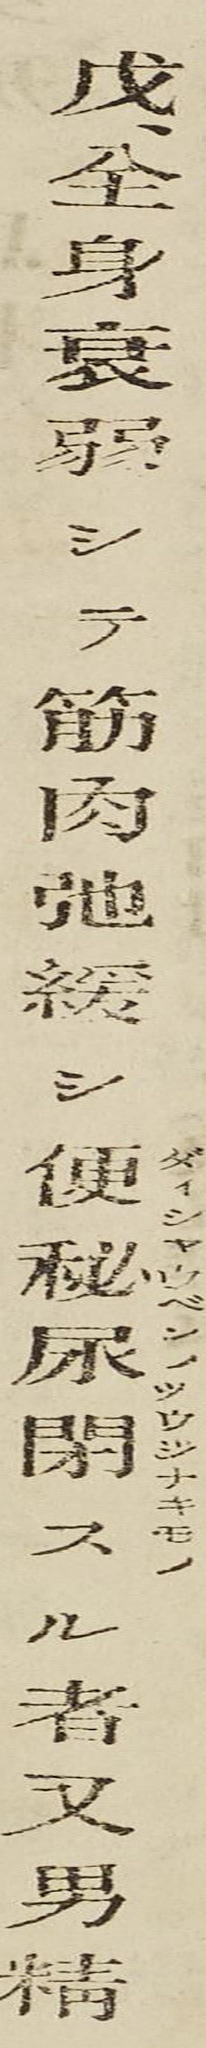戌、全身衰弱シテ筋肉弛緩シ便秘尿閉スル者又男精
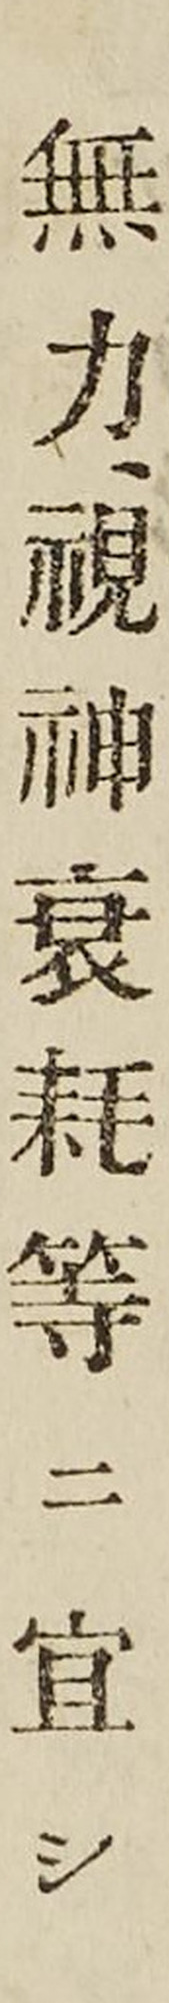無力、視神衰耗等ニ宣シ
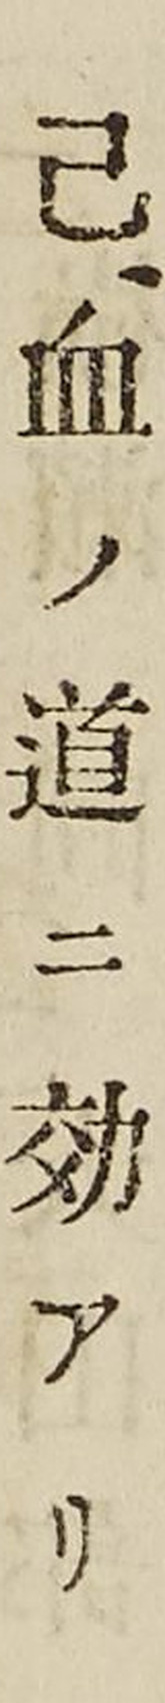己、血ノ道ニ効アリ

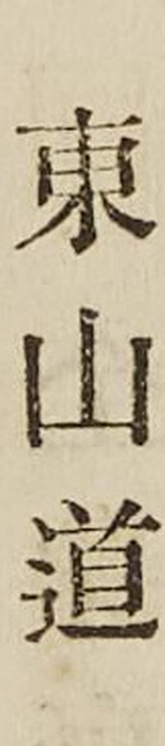東山道
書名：日本温泉考
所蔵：東京大学地震研究所図書室 Earthquake Research Institute Library, The University of Tokyo, JAPAN
